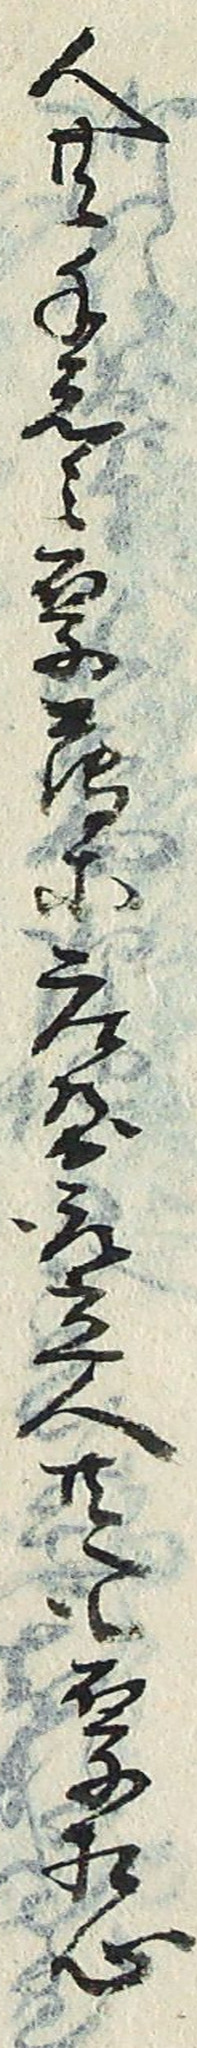人共手元之厚薄等庄屋取立人共へも厚相心
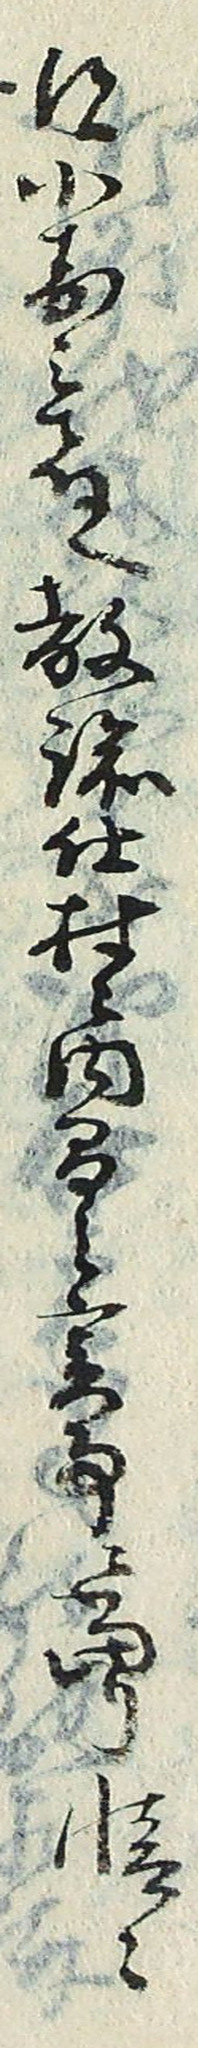得小前之者へ教諭仕村々内間の実事ニ當り情々
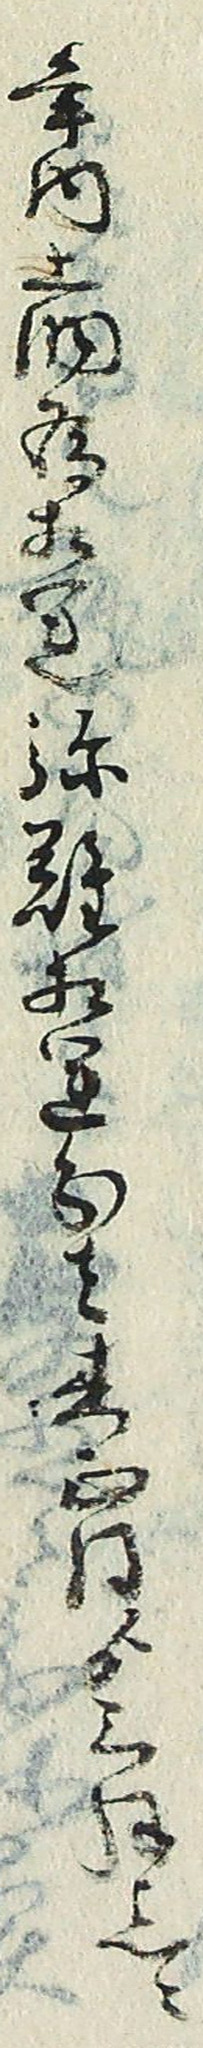年内上納為相運弥難相運分者来正月ゟ三月迄ニ
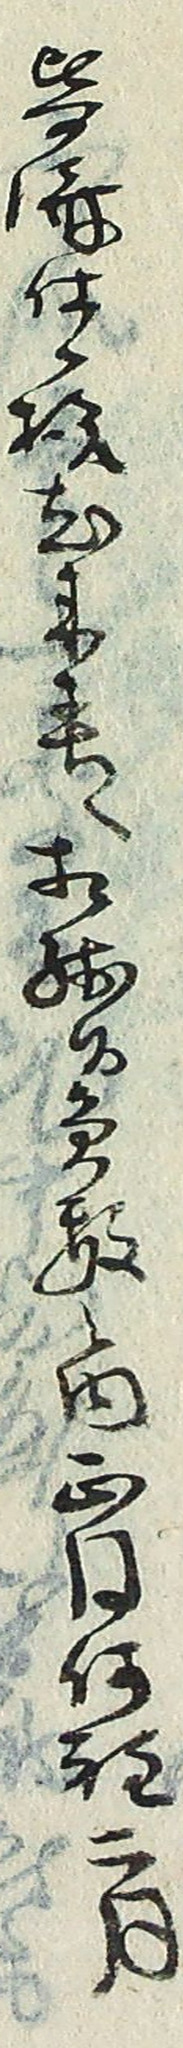皆済仕候様尤来春へ相残候員数之内正月何程二月
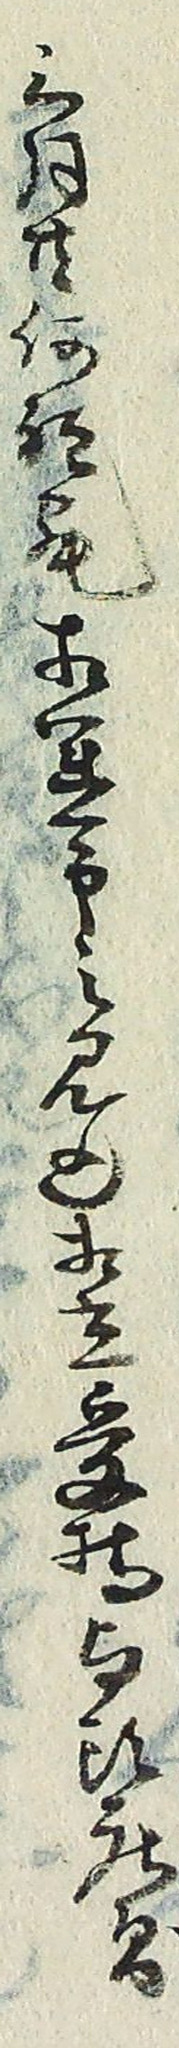三月共何程宛相運可申之見込相立受持与頭庄屋
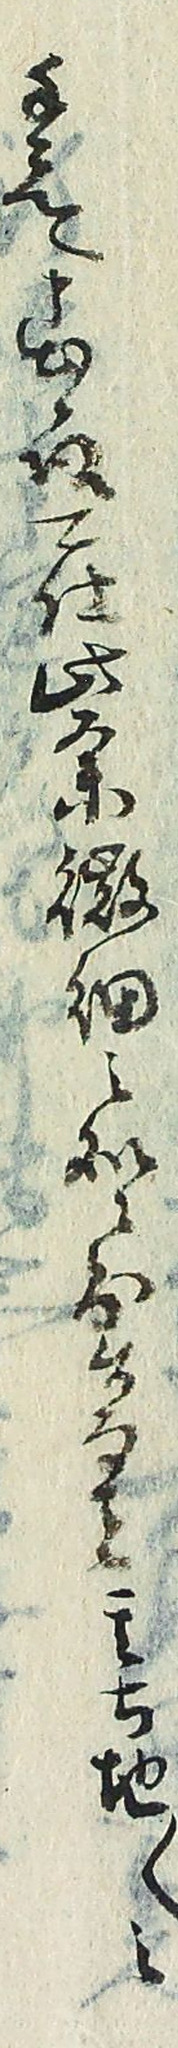手元へ申出候様可仕此条微細之処ニ至候而者其土地〳〵之
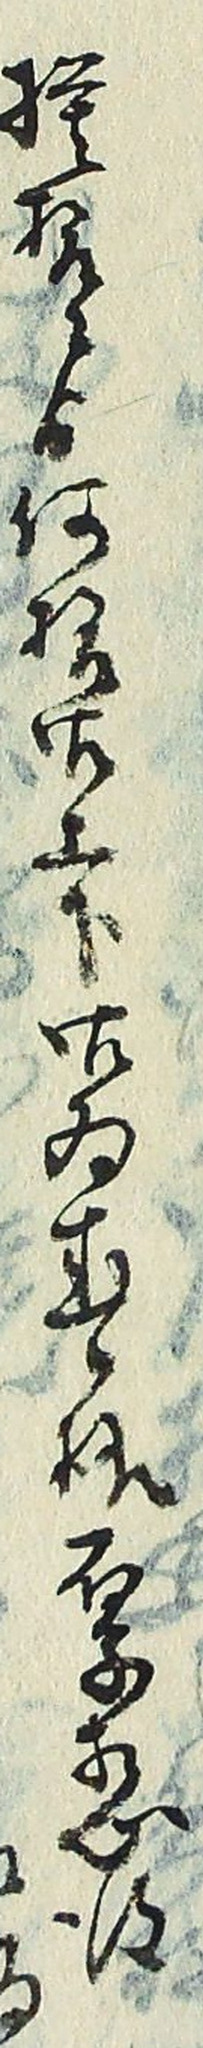模様ニゟ何様御上下御為成候様厚相心得取都可申事
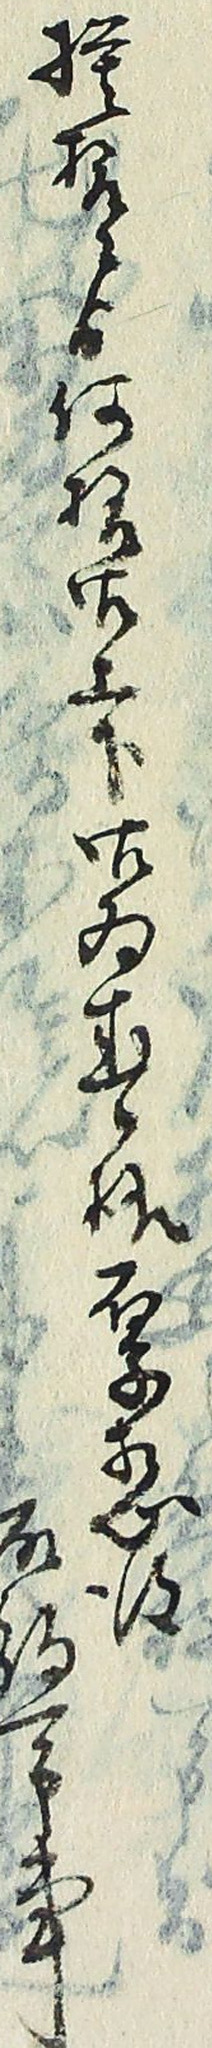模様ニゟ何様御上下御為成候様厚相心得取都可申事

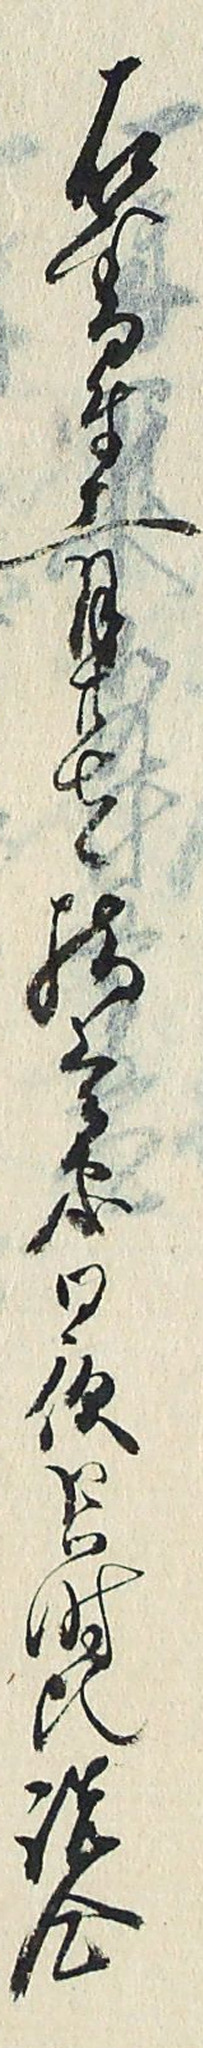右書付十一月廿七日指上候處同夜四ツ時比詰合
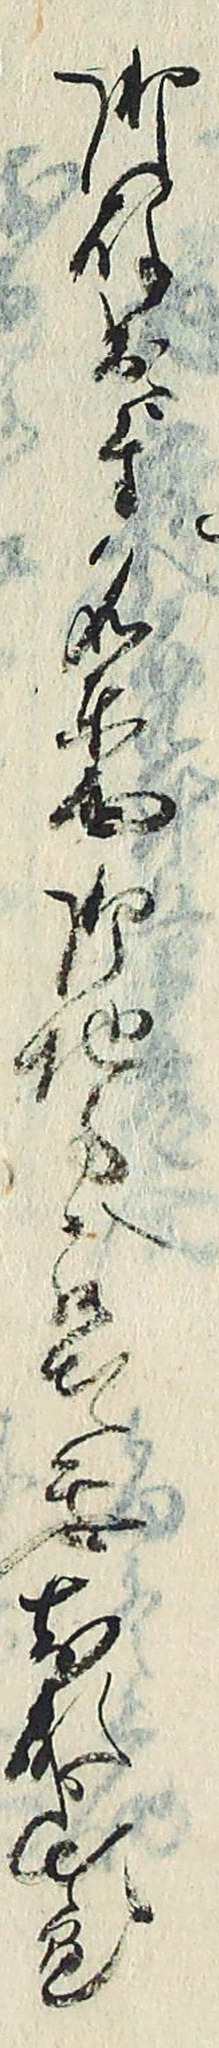御呼出ニ付名東屋御地方へ罷出候處前顕申出候懸
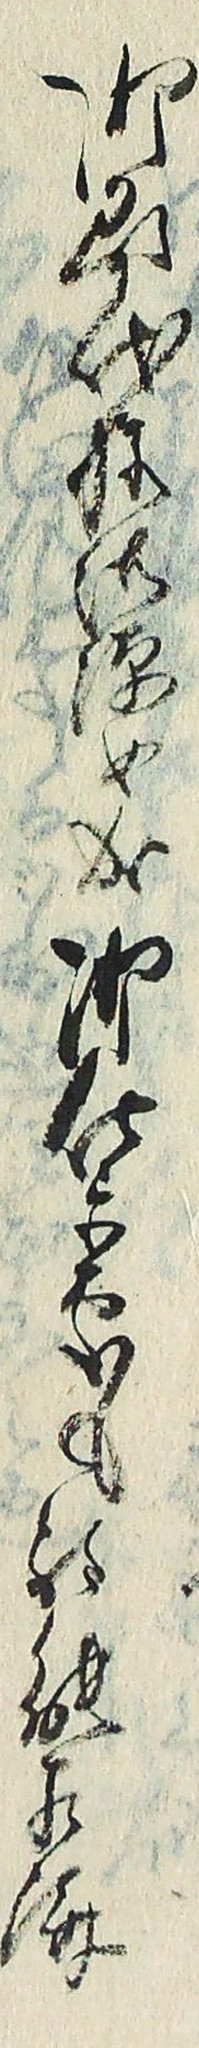御郡代様御評義成御仕置義も程能相済
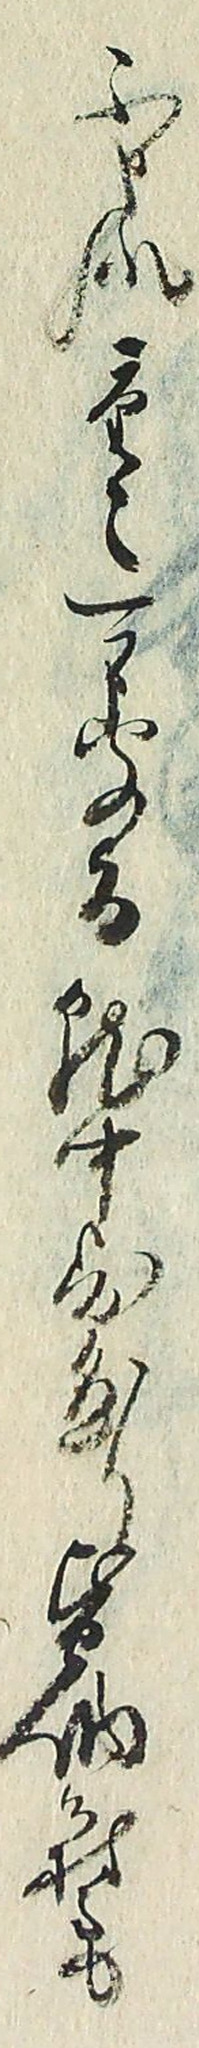不申様重々可申聞旨就中歩懸り皆納候村方も
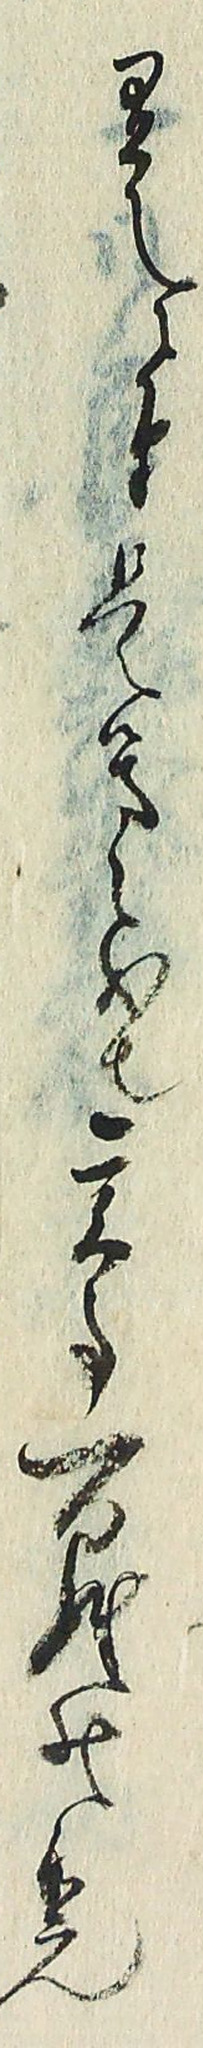有之ニ付是等之義者実事百姓共手元
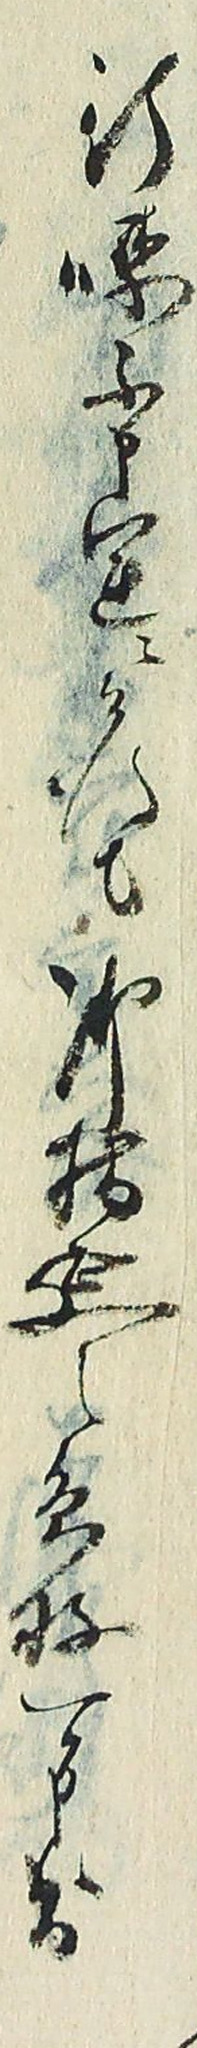行噤不申運ニ候得者御指延之員数可申出
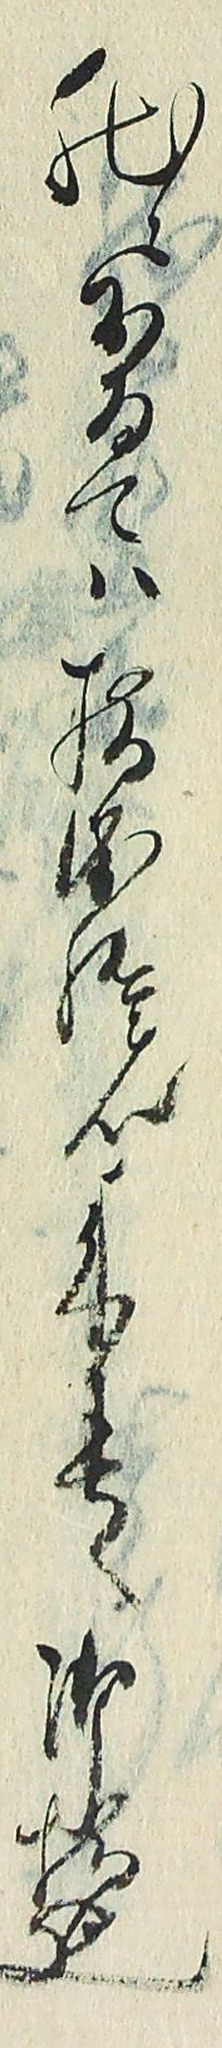然ニおゐてハ指圖継を以来春へ御指延
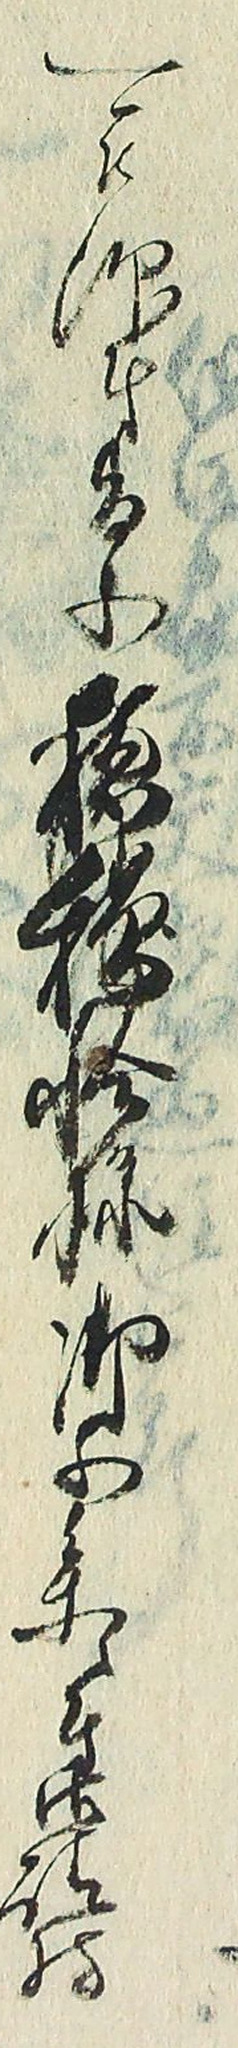可被仰付旨等穂積恰様御不参ニ付御請持
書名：諸御趣意書并御下知向之写
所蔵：鳴門教育大学 Naruto University of Education
